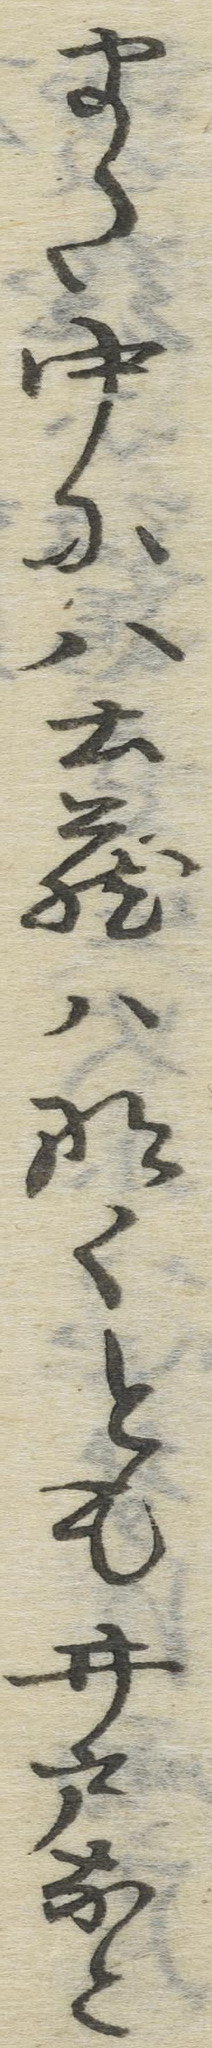また中には土蔵はなくとも井戸なと
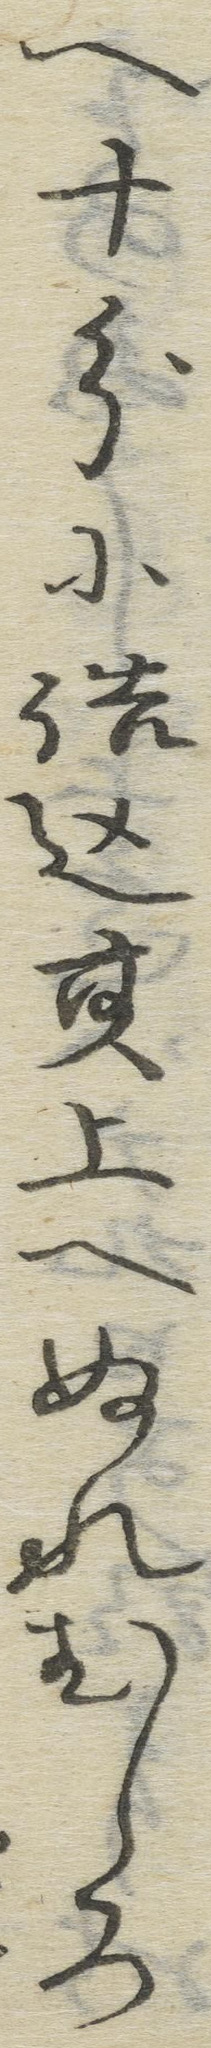へ十分に詰込其上へぬれむしろ
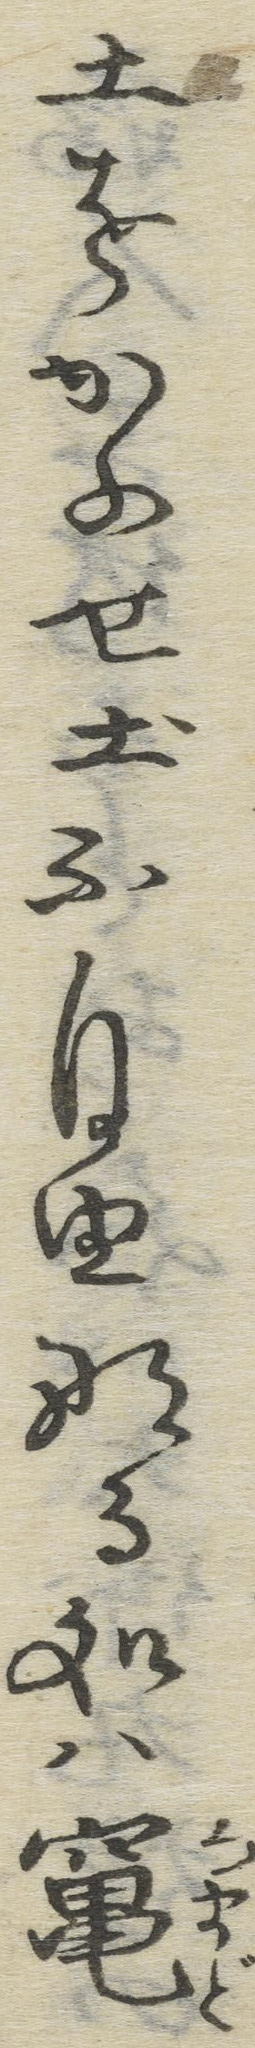土をかふせ土不自由なる処は竈
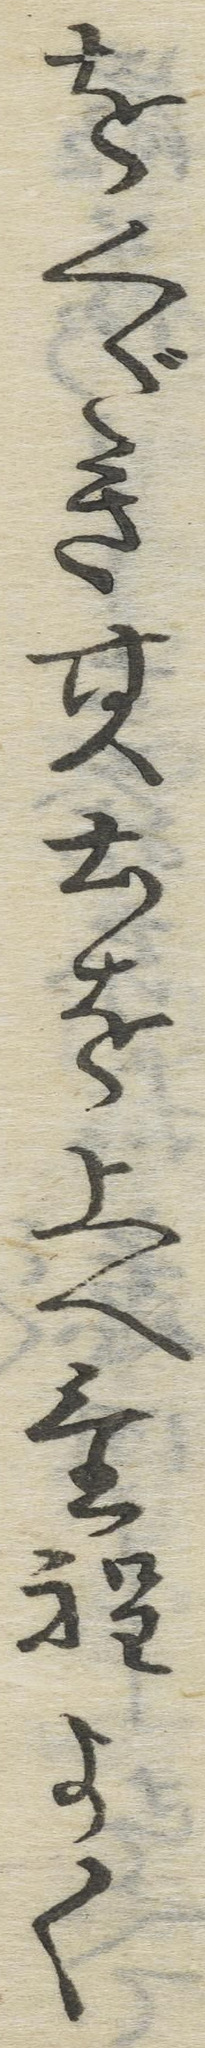をくだき其土を上へ置程よく
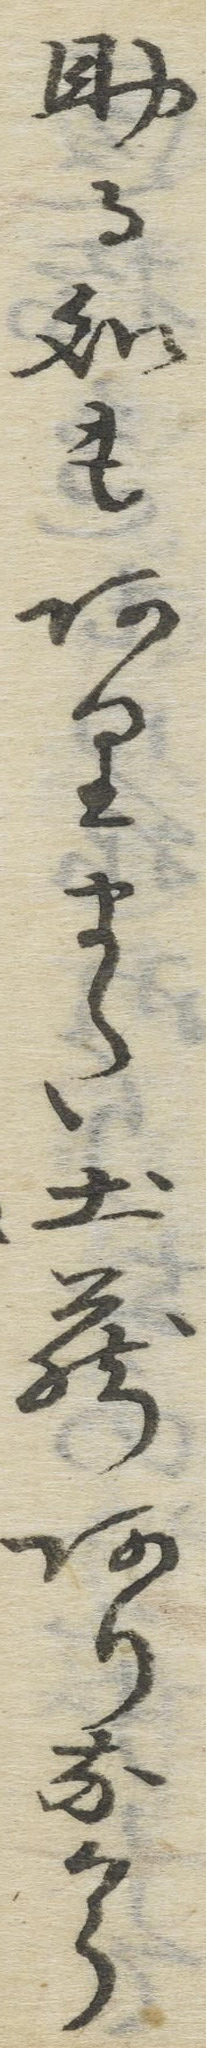助る処もありまた土蔵ありなから
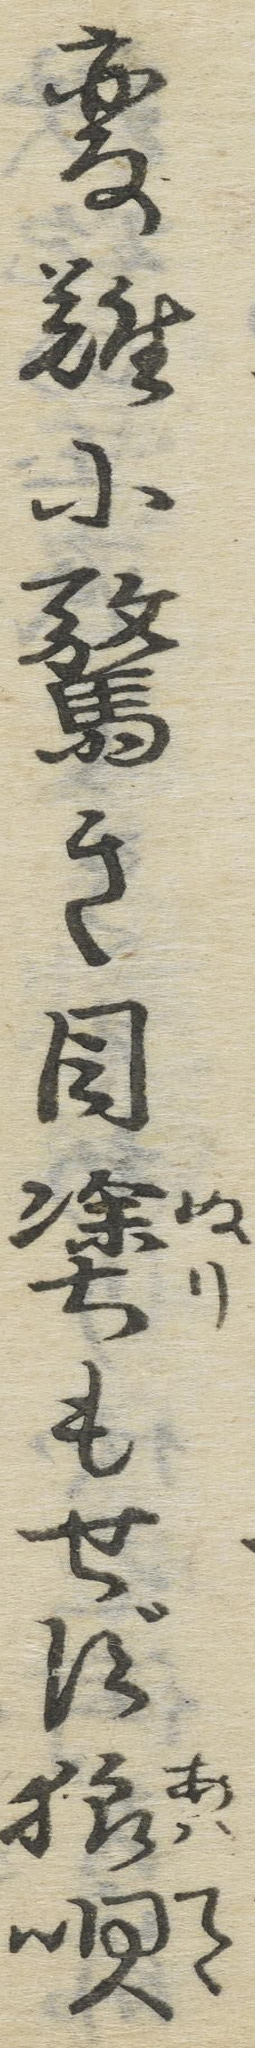変難に驚き目塗もせず狼狽
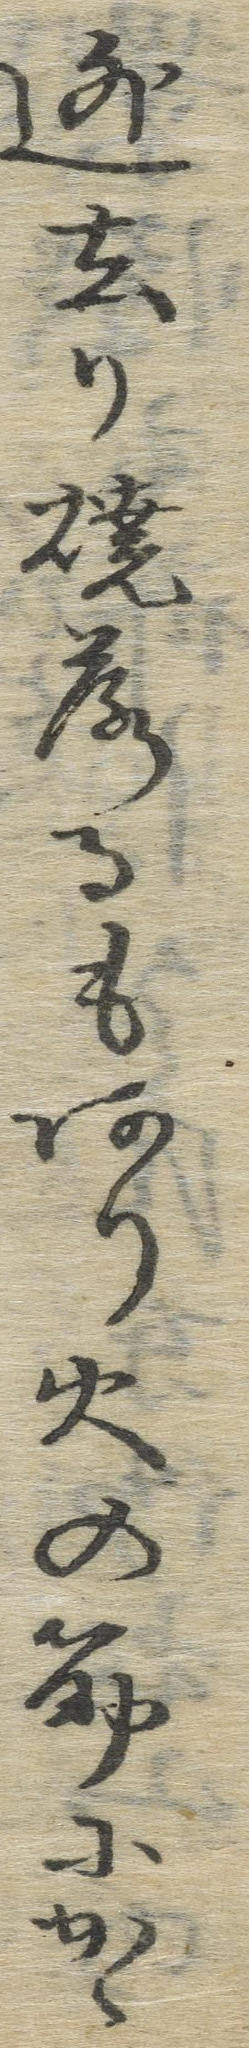逃去り焼落るもあり火の筋にかゝ
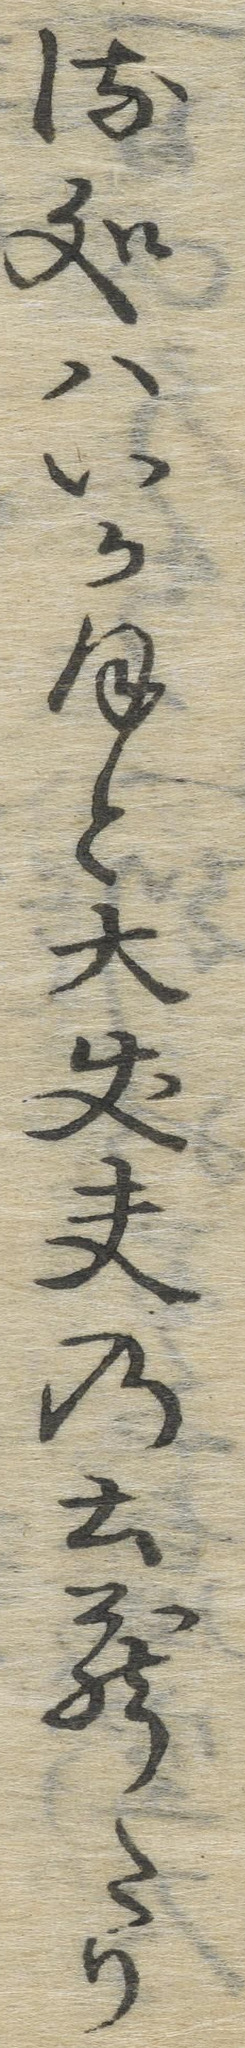る処はいかほと大丈夫の土蔵たり
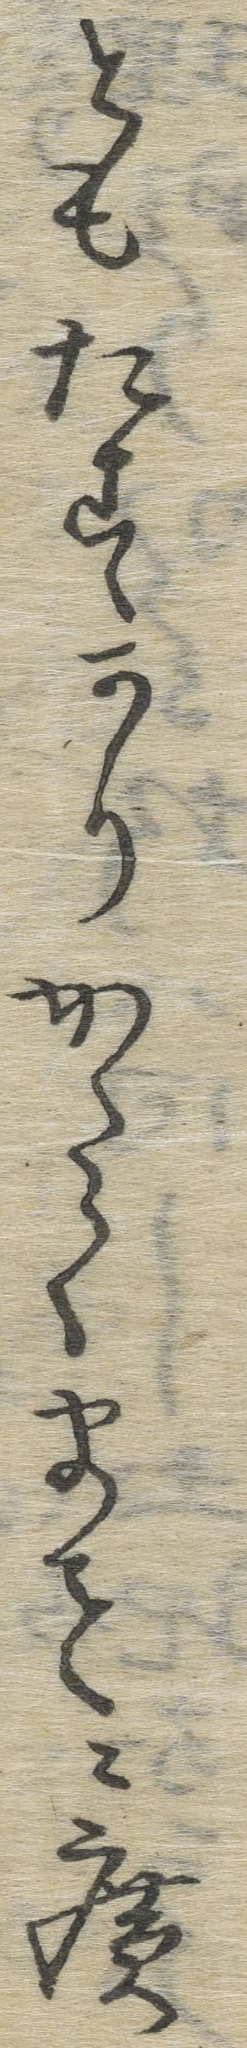ともたすかりかたくまことに廣
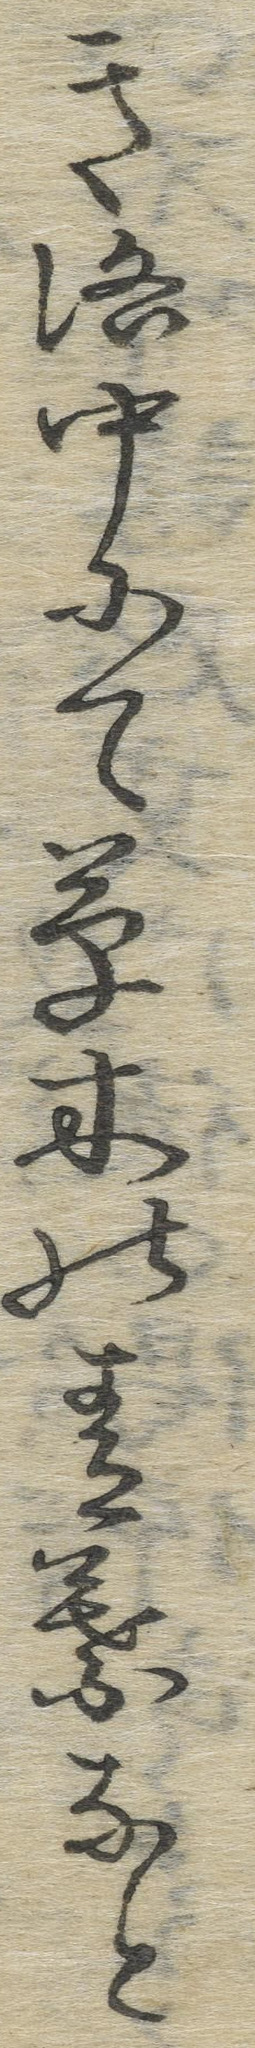き洛中にて草木の青葉なと
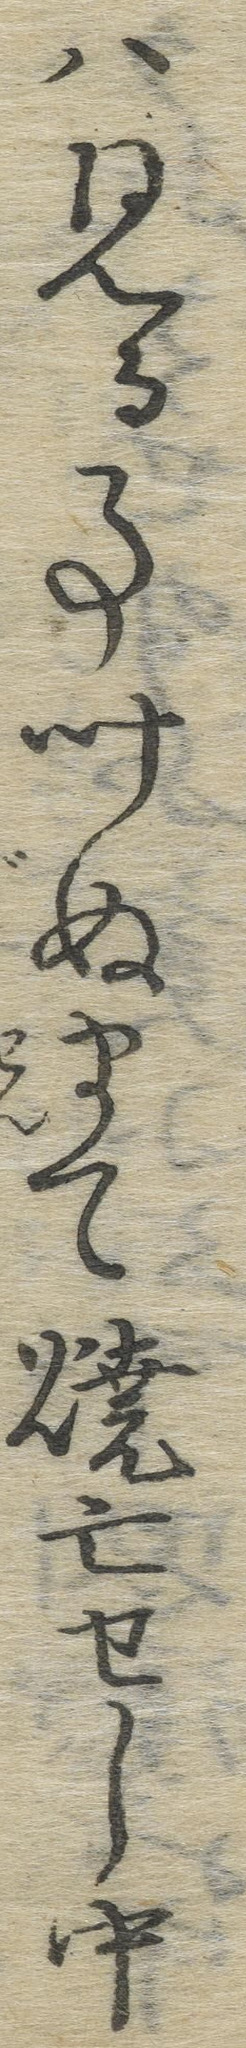は見る事叶ぬまて焼亡せし中
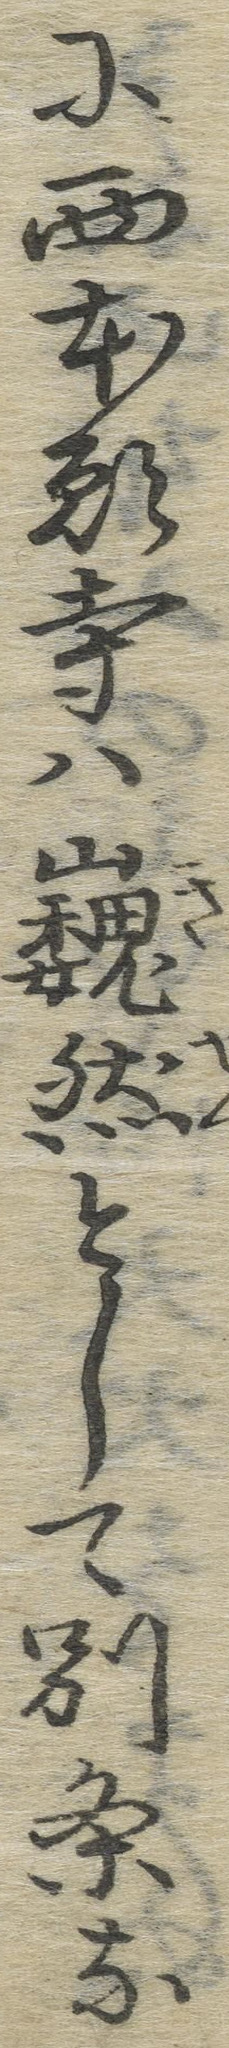に西本願寺は巍然として別条な
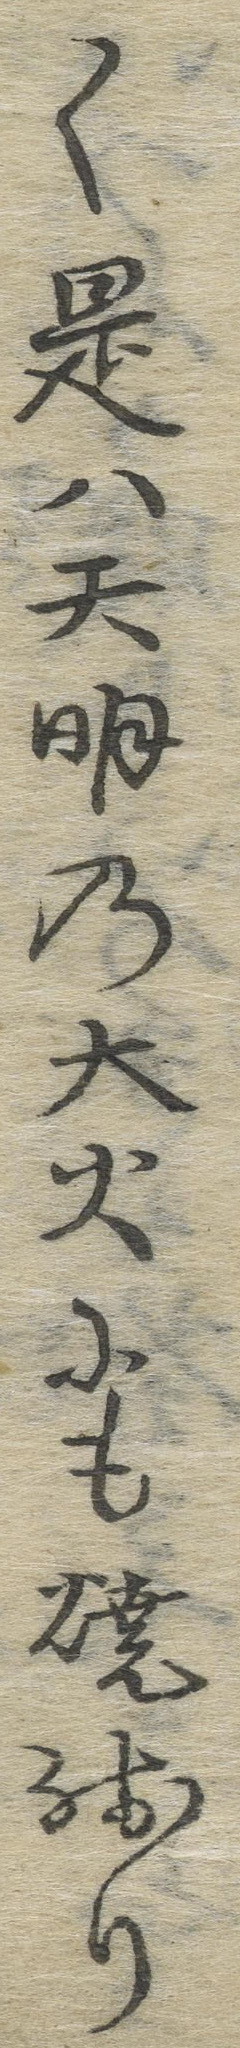く是は天明の大火にも焼残り
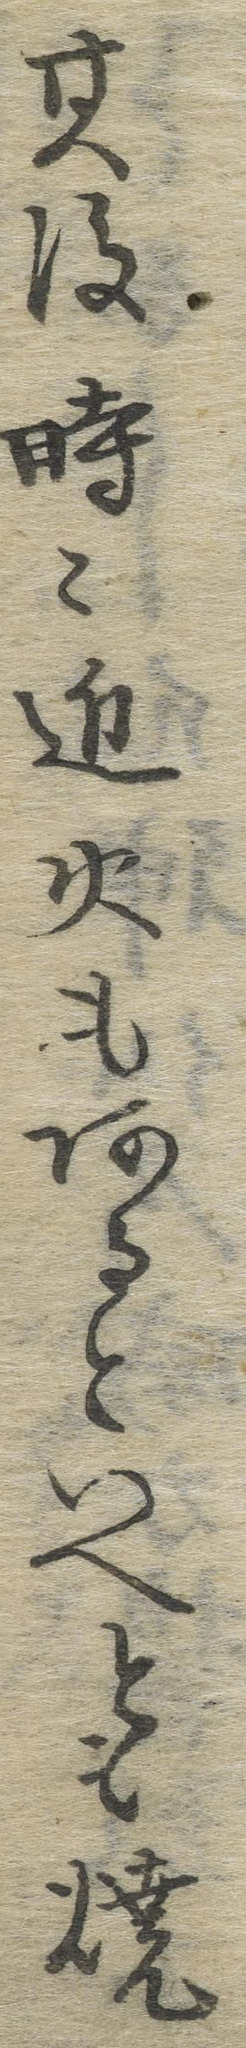其後時々近火もあるといへとも焼

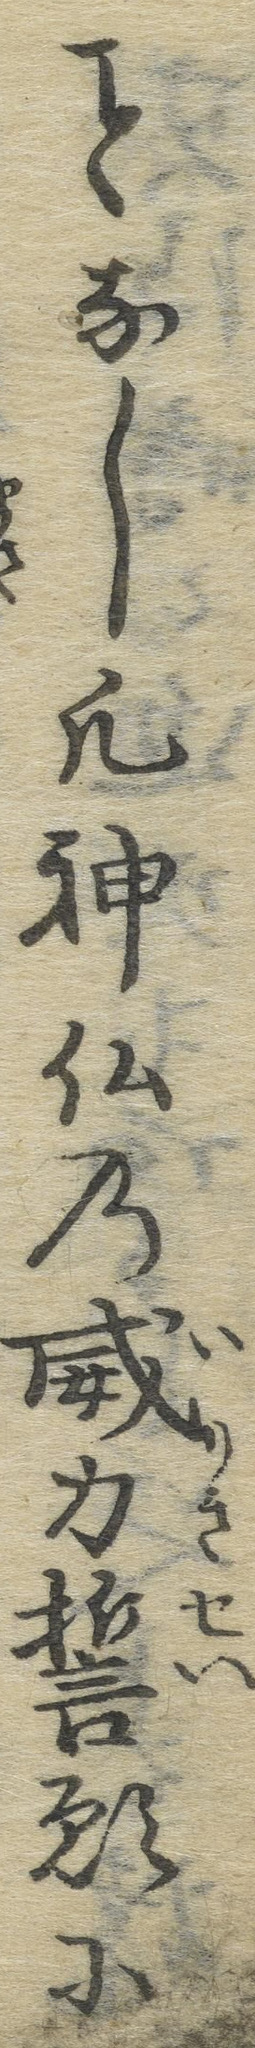ことなし凡神仏の威力誓願に
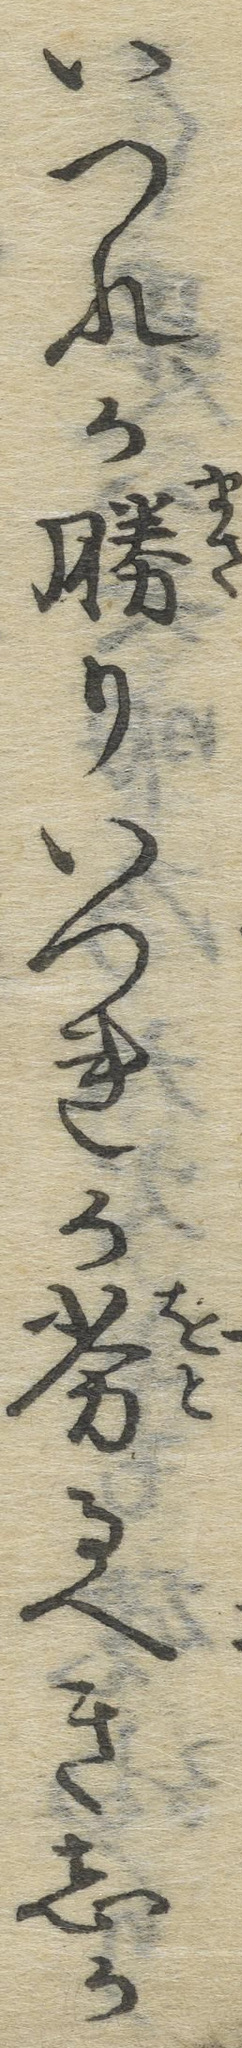いつれか勝りいつれか劣るへきしか
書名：あきの日照
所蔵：東京大学地震研究所図書室 Earthquake Research Institute Library, The University of Tokyo, JAPAN
